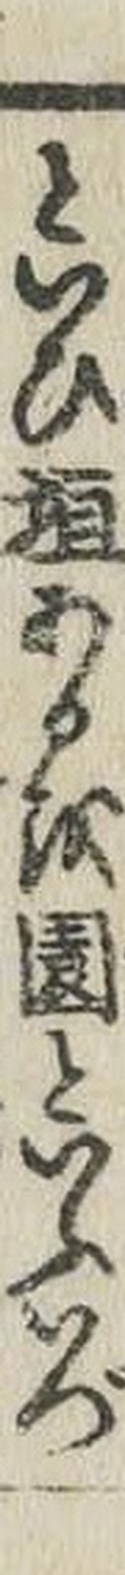といひ垣あるを園といふいづ
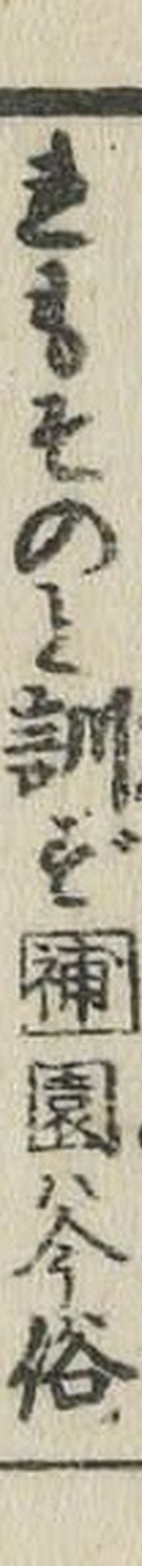れもそのと訓ず補園は今俗
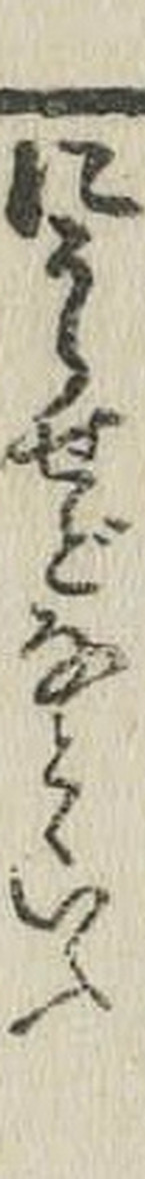にうらせどなとゝいふ
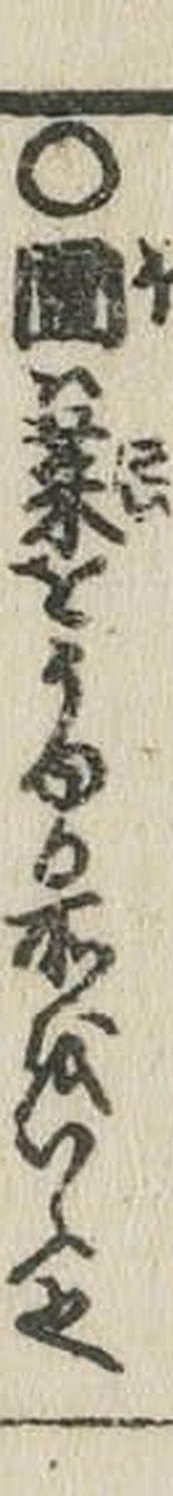○圃は菜をうゆる所をいふ也
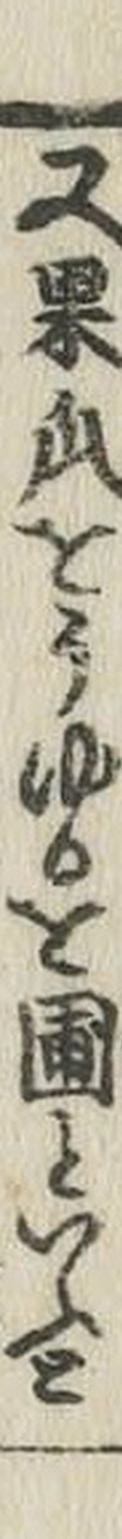又果瓜をうゆるを圃といふと
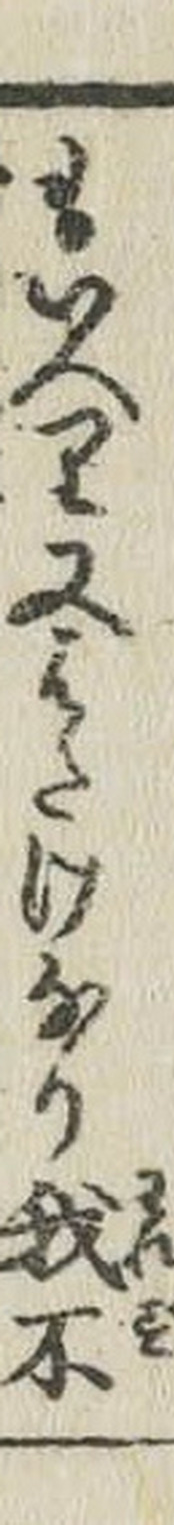もいへり又はたけなり我不
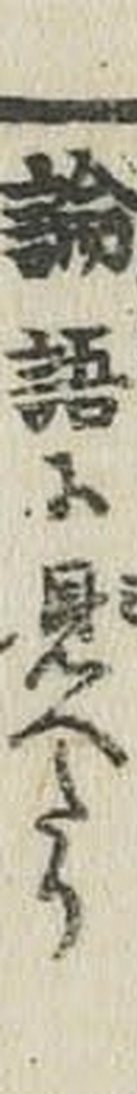論語に見へたり
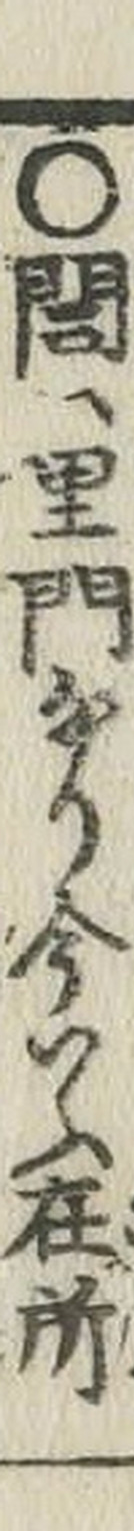○閭は里門なり今いふ在所
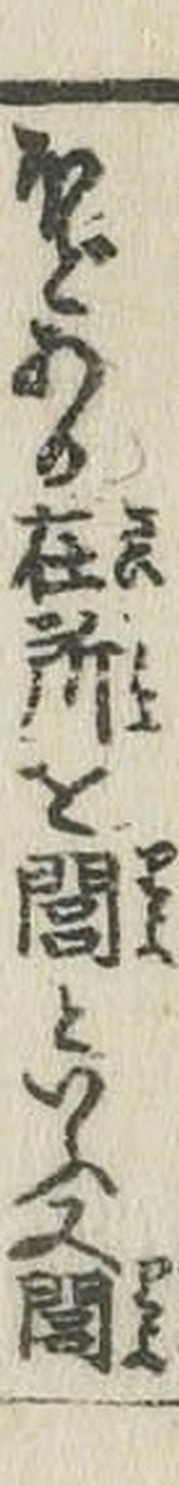ほどある在所を閭といふ又閭
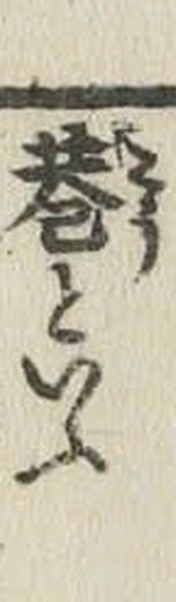巷といふ
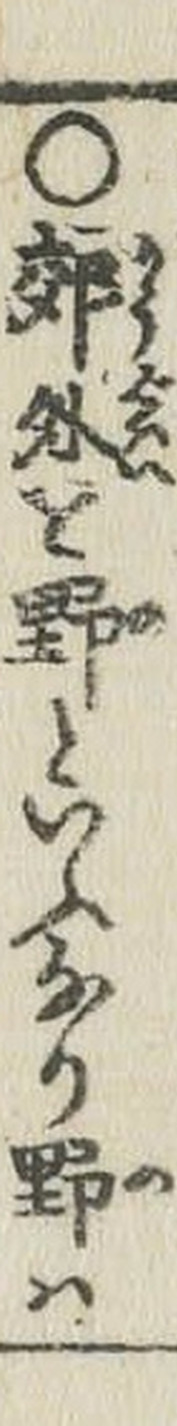○郊外を野といふなり野は
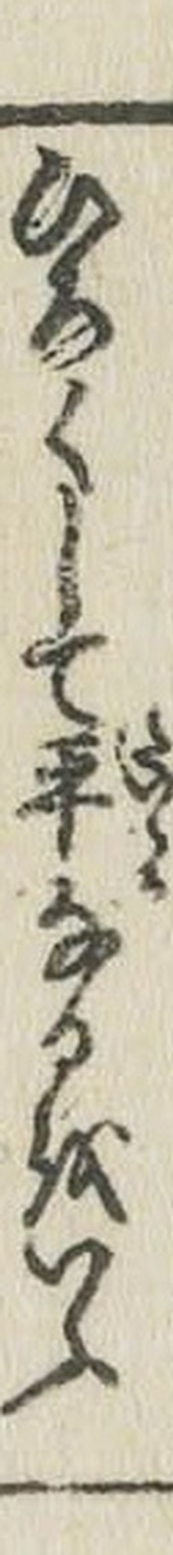ひろくして平なるをいふ
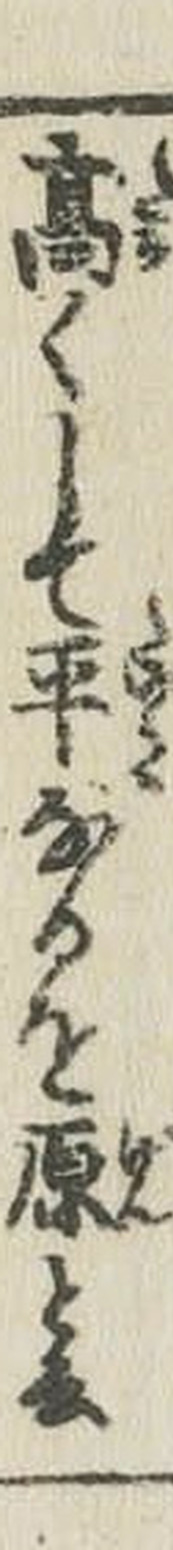高くして平なるを原と云
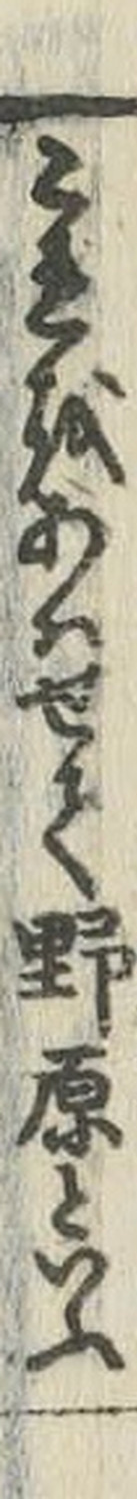これをあはせて野原といふ
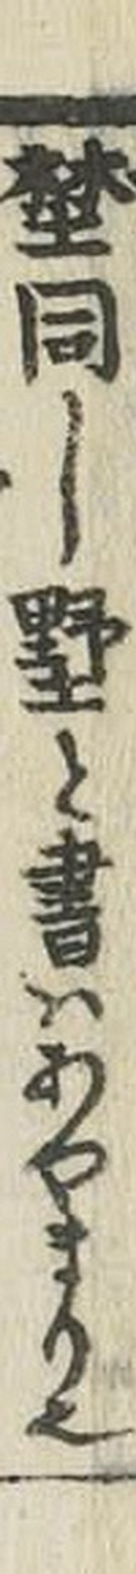埜同し墅と書はあやまり也
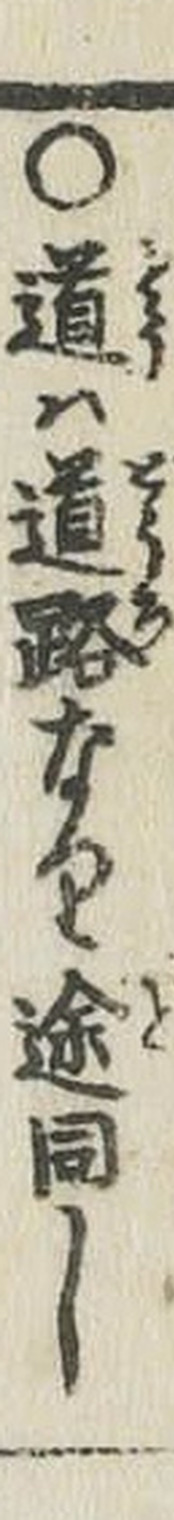○道は道路なり途同し
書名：増補頭書訓蒙図彙大成 10巻 2:巻之1-3
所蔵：東京学芸大学教育コンテンツアーカイブ
